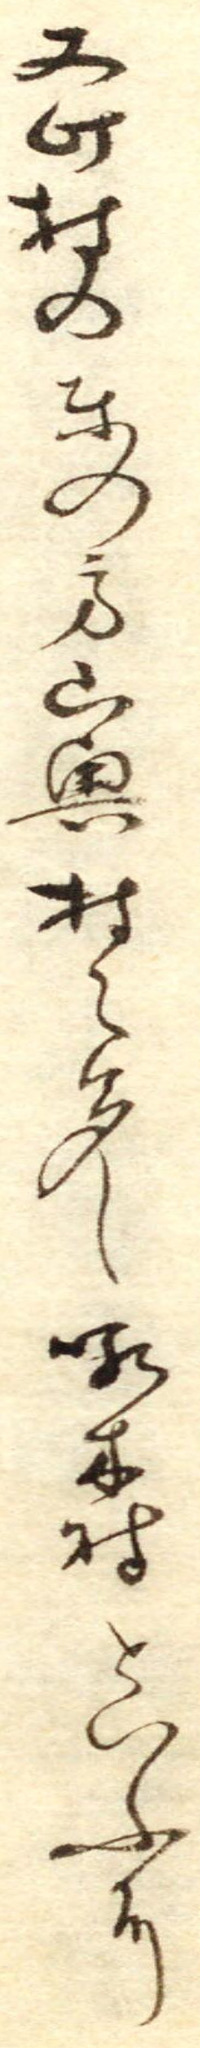又此村の東の方山奥村々多し吼木村といふに
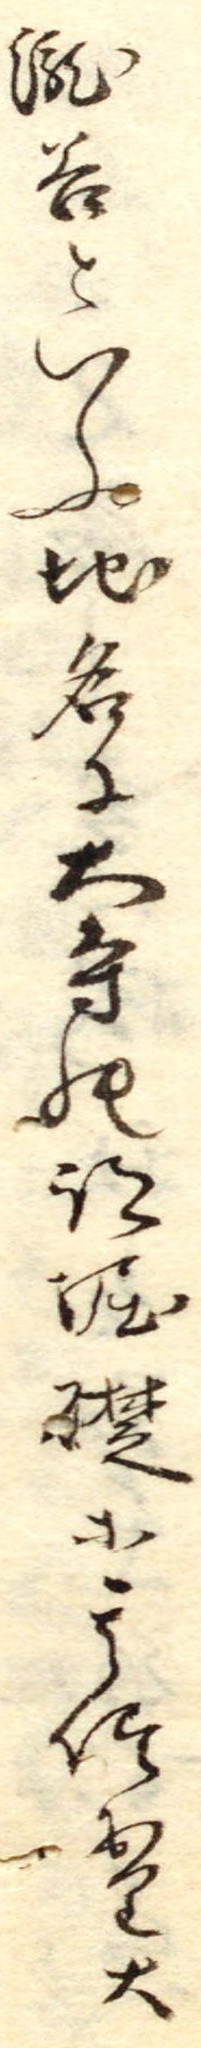瀧谷といふ地名に大寺の跡堀礎等其侭あり大
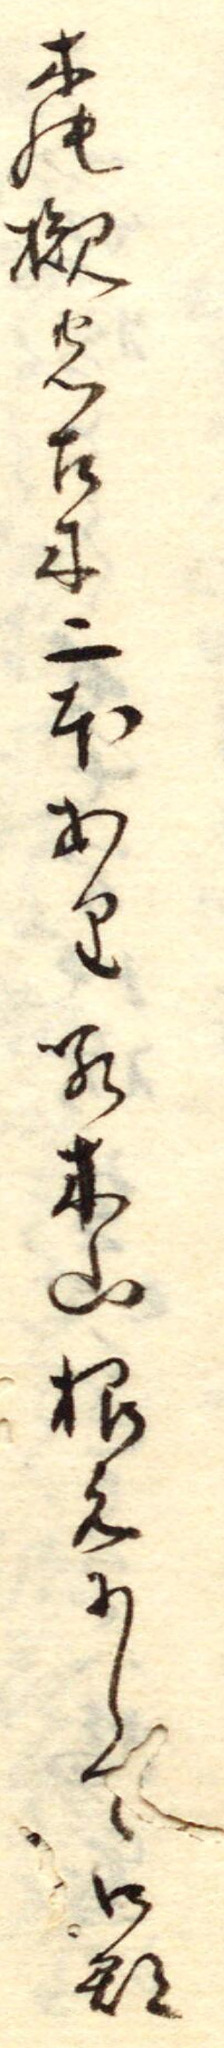木の槻の古木二本あり吼木山根元にて口郡
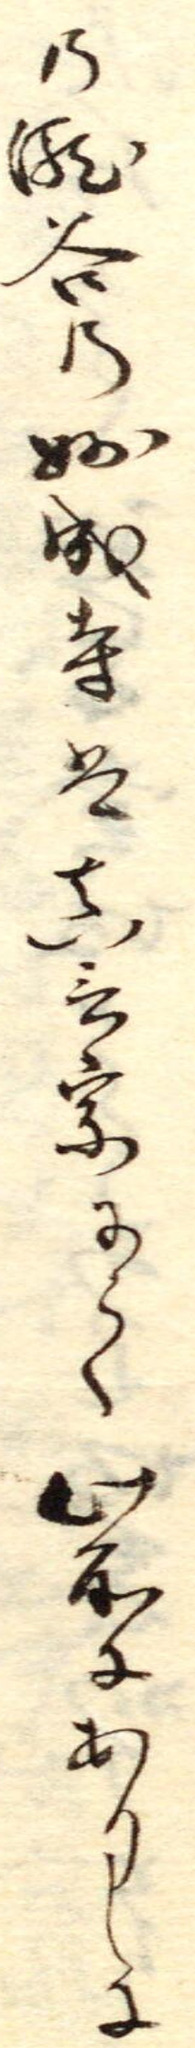の瀧谷の妙成寺は真言宗にて此所にありしに
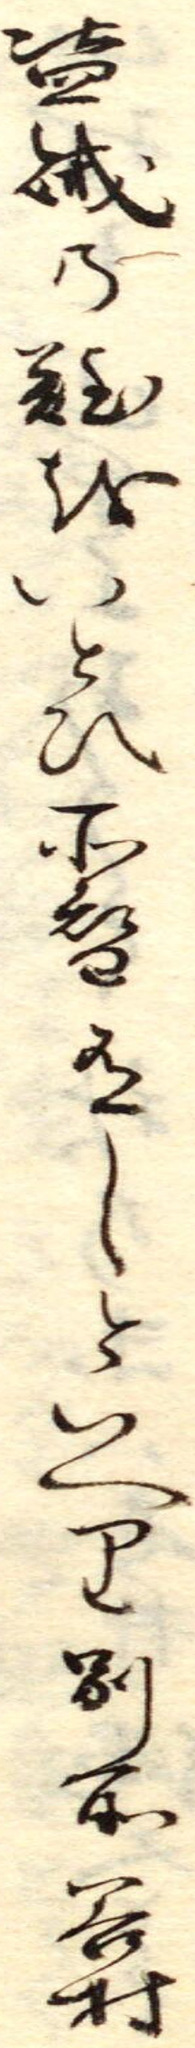盗賊の難をいとひ所替有しといへり別所谷村
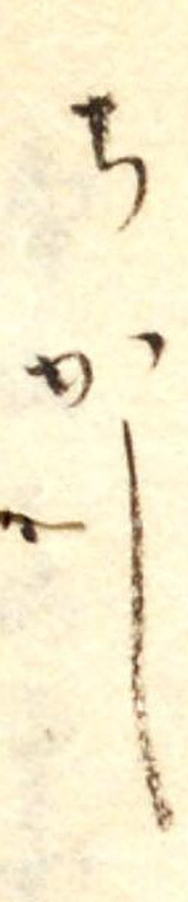ちかし

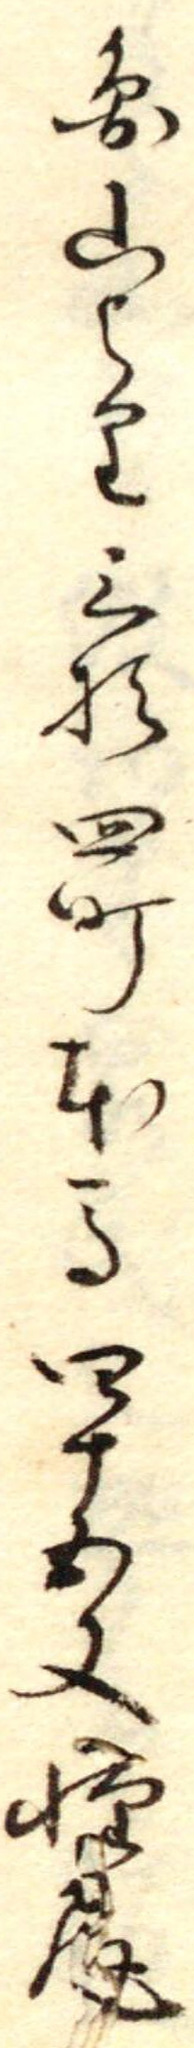円山より三拾四町本馬四十五文軽尻
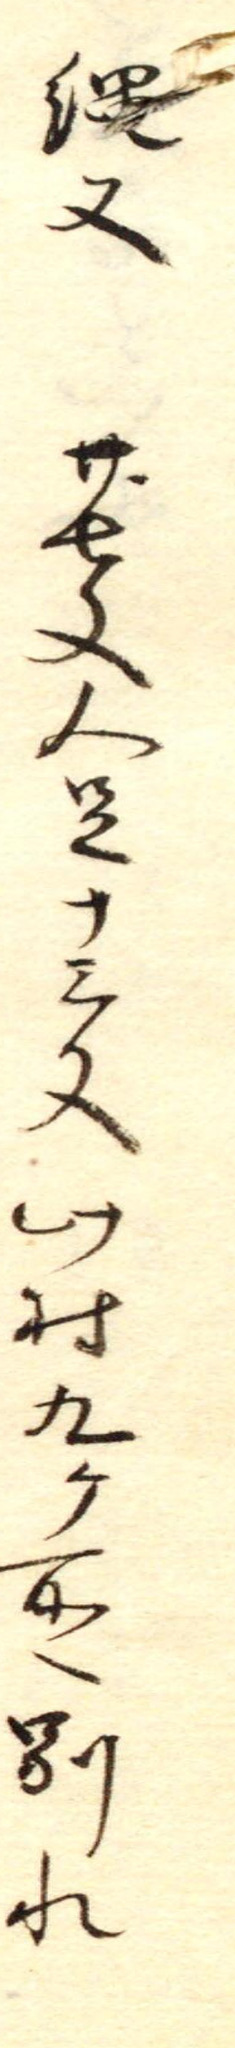縄又廿七文人足十三文此村九ヶ所へ別れ
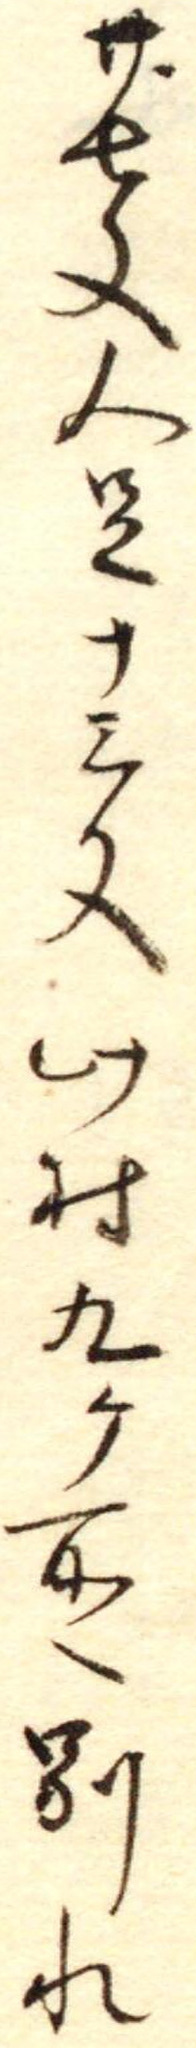縄又廿七文人足十三文此村九ヶ所へ別れ
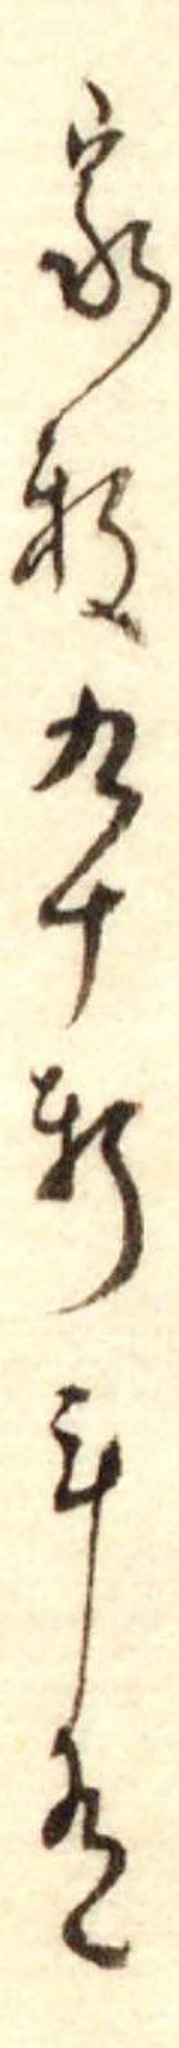家数九十軒計有
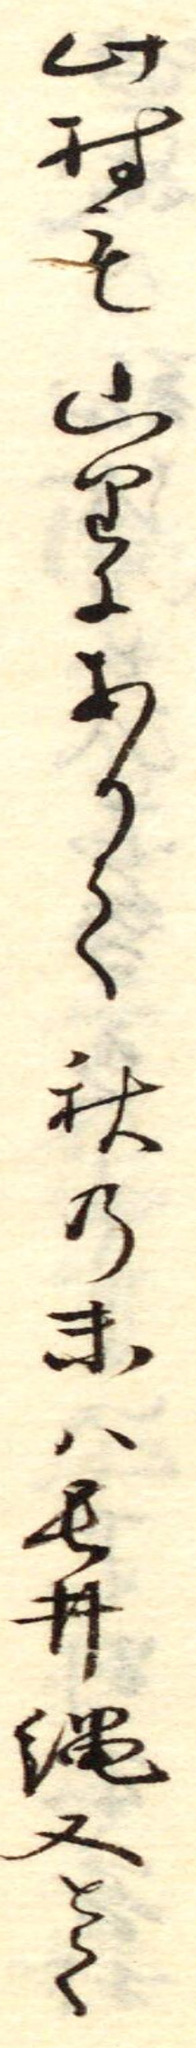此村も山里にありて秋の末は長井縄又とて
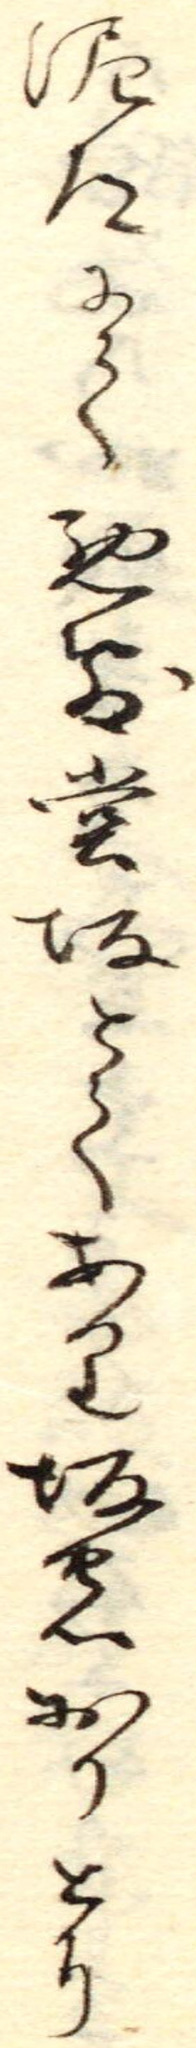泥道にて悪敷堂坂とてあり坂のおりとに
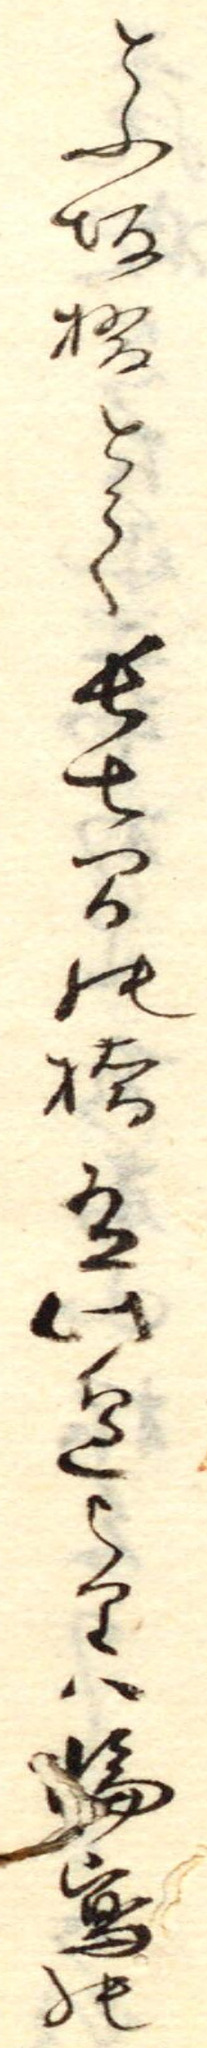とふ坂橋とて長七間の橋有此辺より輪嶌の
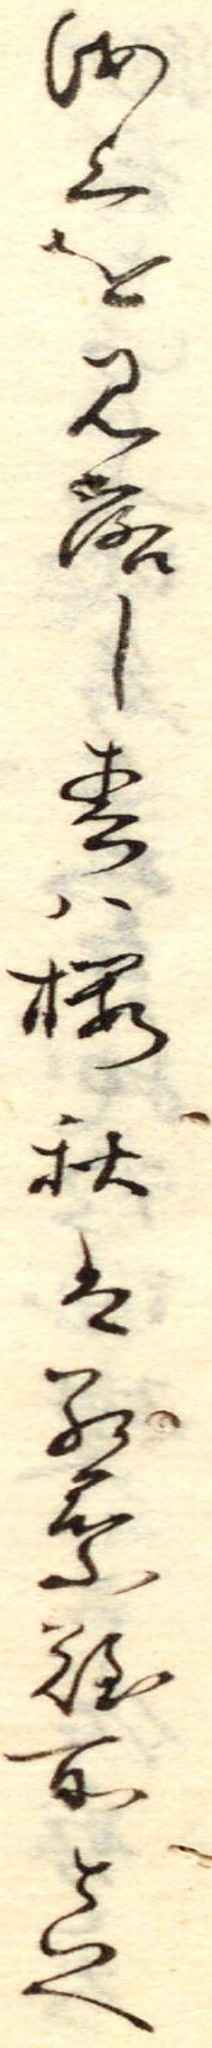海上を見落し春は桜秋は紅葉難所といへ
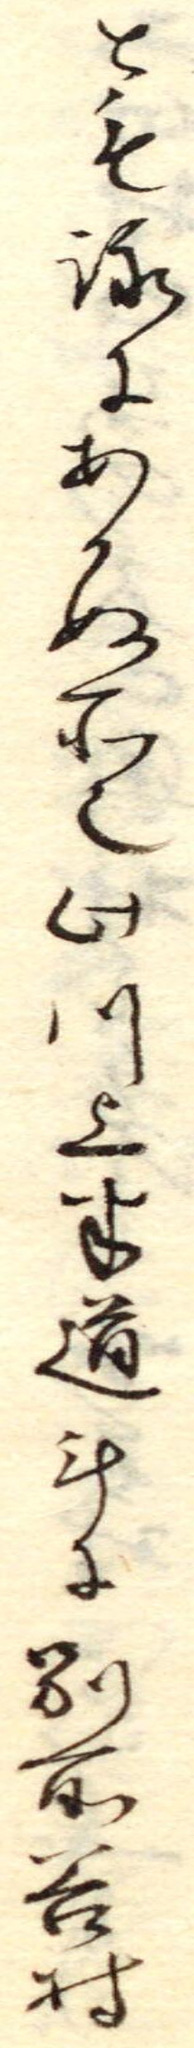とも詠にあかぬ所也川上半道計に別所谷村
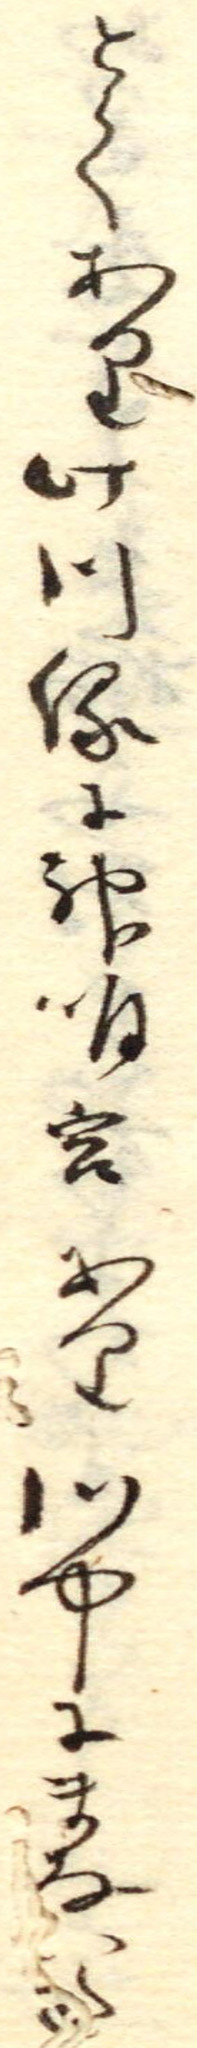とてあり此川縁に神明宮ありじゅう川中にまないた
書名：能登名跡誌
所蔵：Ishikawa Prefectural Library
